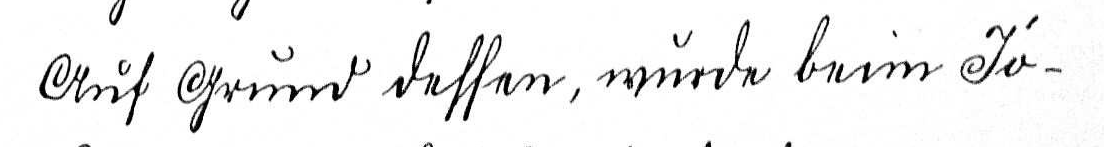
Auf Grund dessen, wurde beim Jó¬
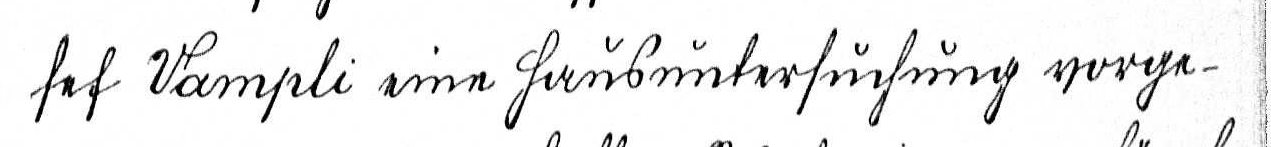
sef Vampli eine Hausuntersuchung vorge¬
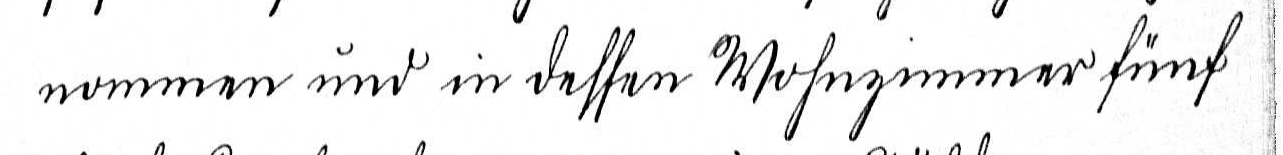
nommen und in dessen Wohnzimmer fünf
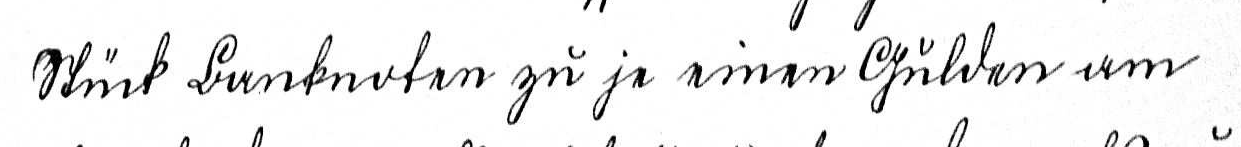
Stück Banknoten zu je einen Gulden am
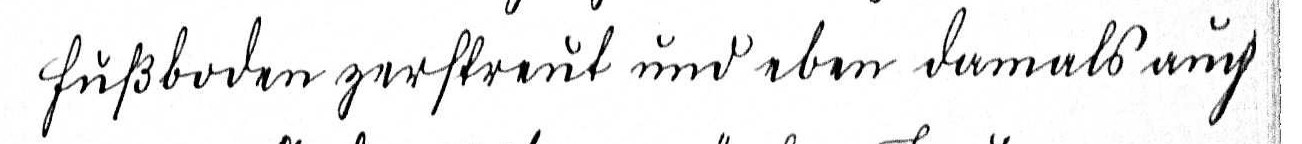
Fußboden zerstreut und eben damals auch
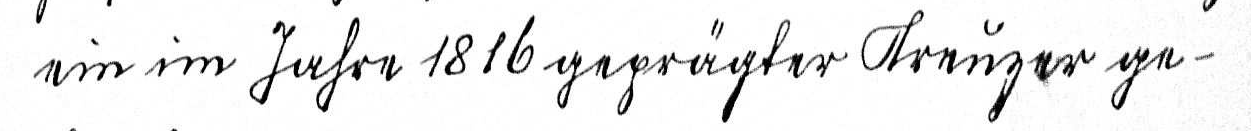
ein im Jahre 1816 geprägter Kreuzer ge¬
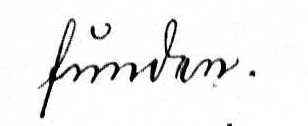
funden.
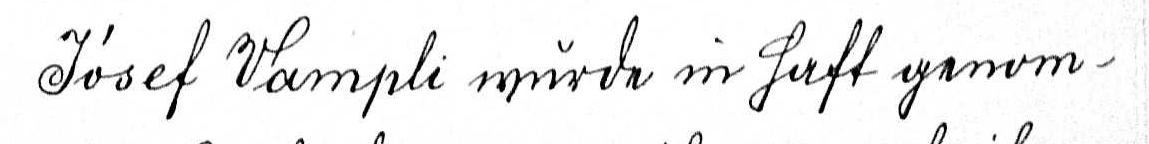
Jósef Vampli wurde in Haft genom¬
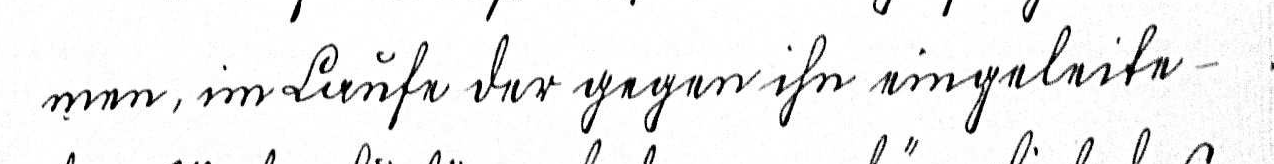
men, in Laufe der gegen ihn eingeleite¬
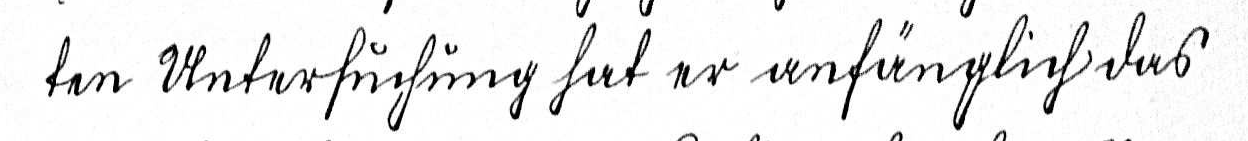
ten Untersuchung hat er anfänglich das
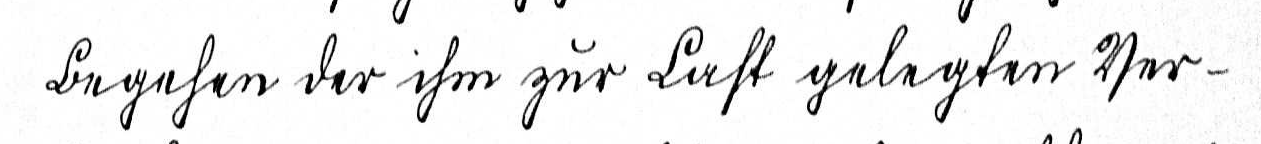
Begehen der ihm zur Last gelegten Ver¬
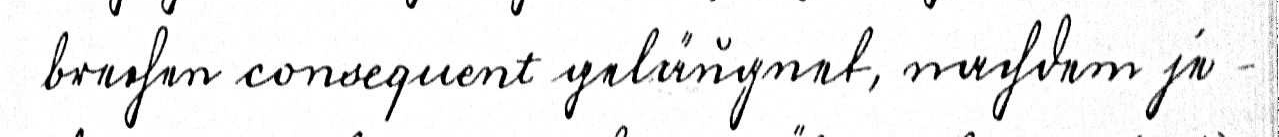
brechen consequent geläugnet, nachdem je¬
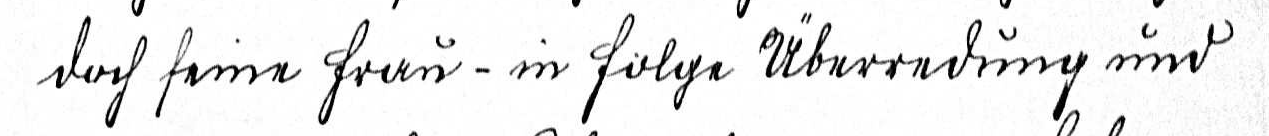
doch seine Frau – in Folge Überredung und
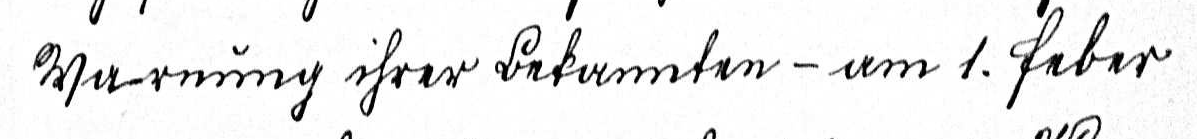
Warnung ihrer Bekannten – am 1. Feber
